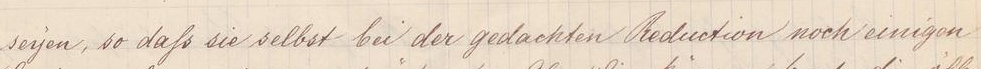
seyen, so daß sie selbst bei der gedachten Reduction noch einigen
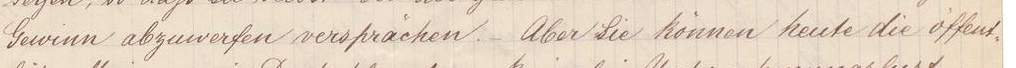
Gewinn abzuwerfen versprächen. – Aber Sie können heute die öffent-
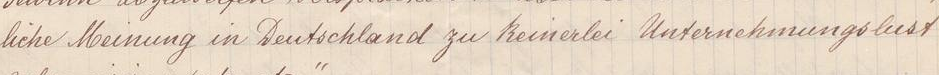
liche Meinung in Deutschland zu keinerlei Unternehmungslust
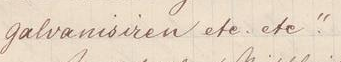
galvanisiren etc. etc.»
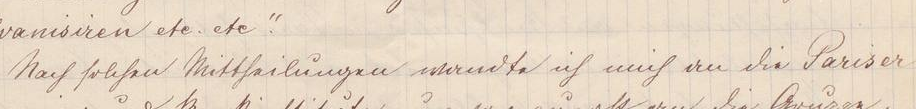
Nach solchen Mittheilungen wandte ich mich an die Pariser
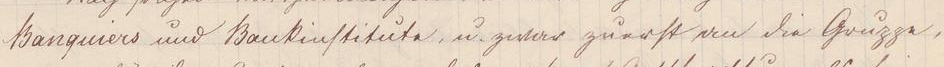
Banquiers und Bankinstitute, u. zwar zuerst an die Gruppe,
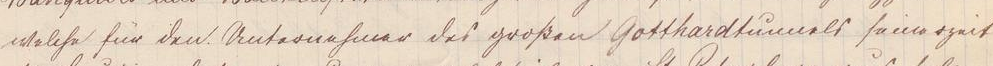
welche für den Unternehmer des großen Gotthardtunnels seinerzeit
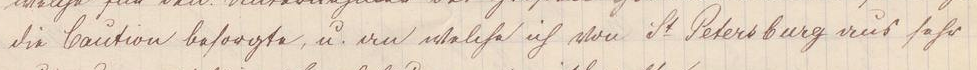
die Caution besorgte, u. an welche ich von St Petersburg aus sehr
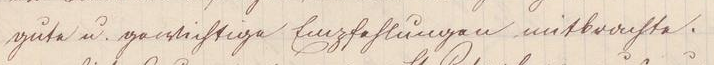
gute u. gewichtige Empfehlungen mitbrachte.
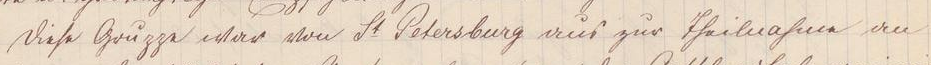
Diese Gruppe war von St Petersburg aus zur Theilnahme an
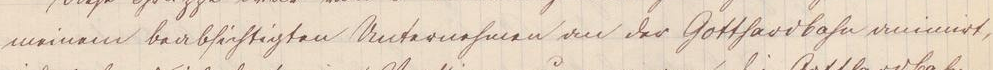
meinem beabsichtigten Unternehmen an der Gotthardbahn animirt,
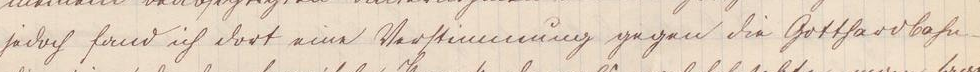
jedoch fand ich dort eine Verstimmung gegen die Gotthardbahn-
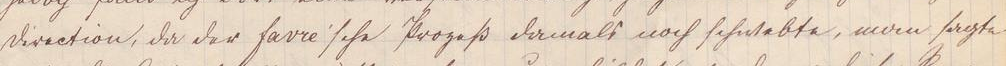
Direction, da der Favre'sche Prozeß damals noch schwebte, man sagte
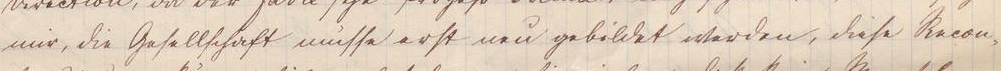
mir, die Gesellschaft müsse erst neu gebildet werden, diese Recon-
